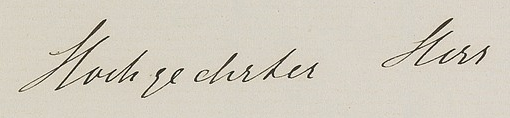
Hochgeehrter Herr
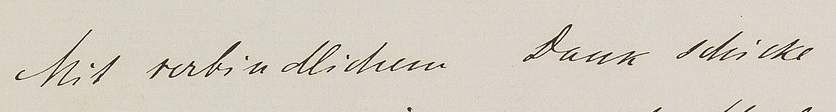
Mit verbindlichem Dank schicke
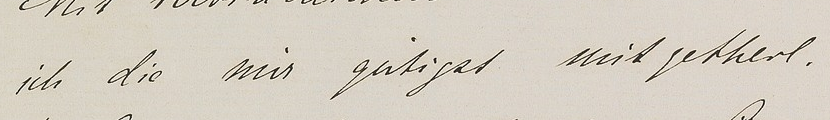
ich die mir gütigst mitgetheil-
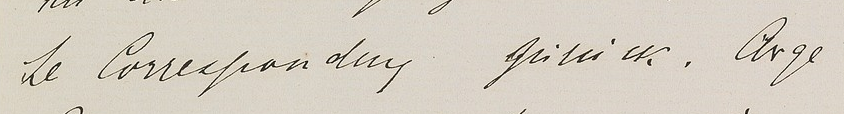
te Correspondenz zurück. Arge
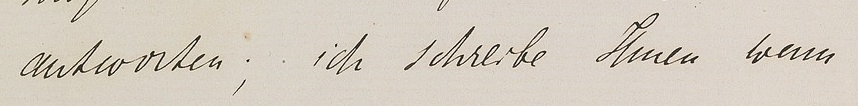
antworten; ich schreibe Ihnen wenn
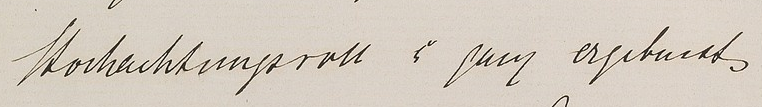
Hochachtungsvoll u ganz ergebenst
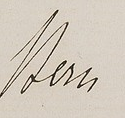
Welti
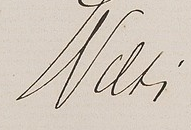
Bern
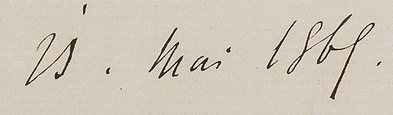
23. Mai 1869.
